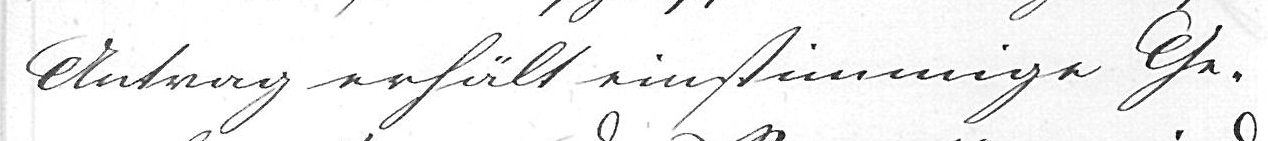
Antrag erhält einstimmige Ge-
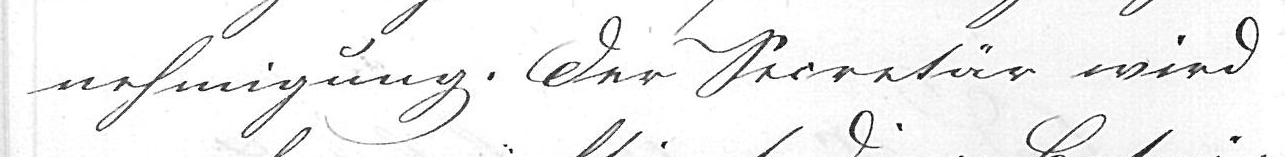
nehmigung. Der Secretär wird
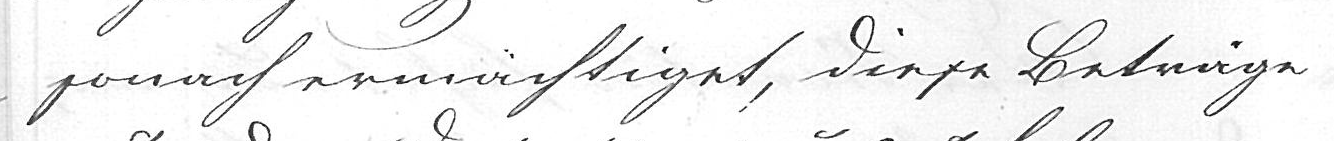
sonach ermächtiget, diese Beträge
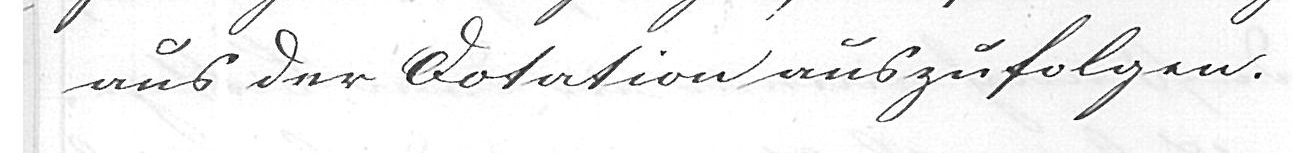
aus der Dotation auszufolgen.
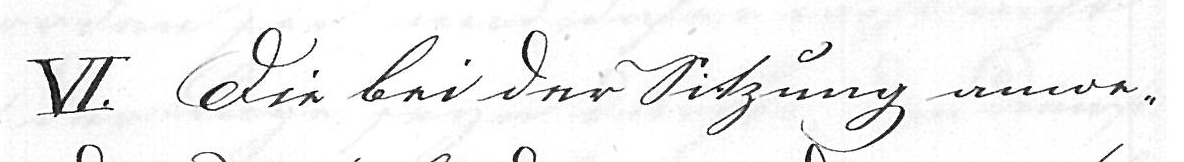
VI. Die bei der Sitzung anwe-
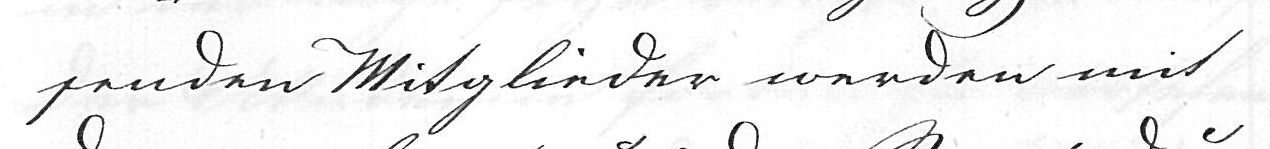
senden Mitglieder werden mit
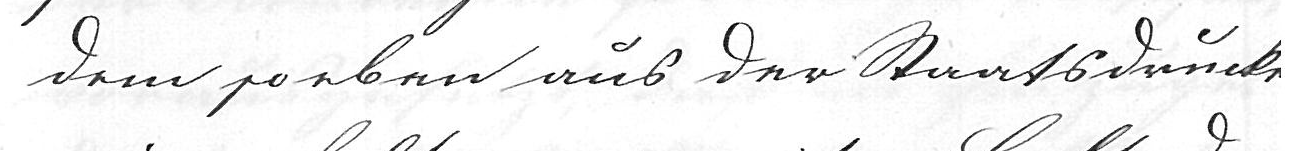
dem soeben aus der Staatsdrucke-
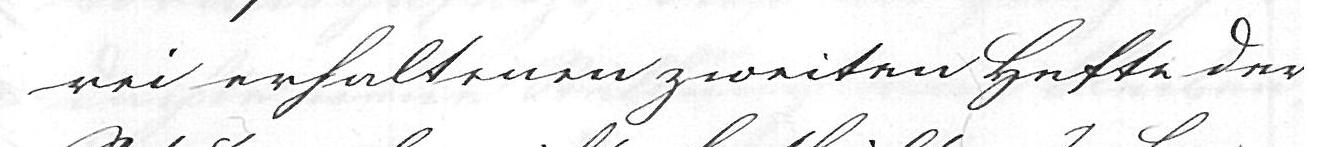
rei erhaltenen zweiten Hefte der
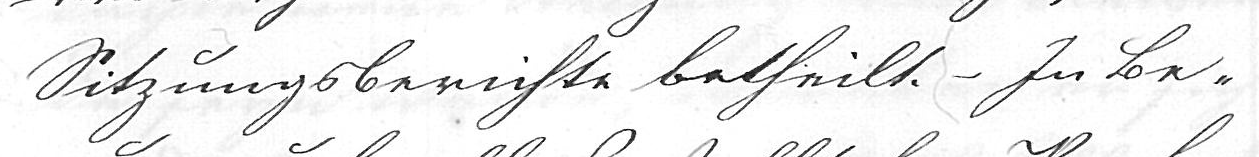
Sitzungsberichte betheilt. In Be-
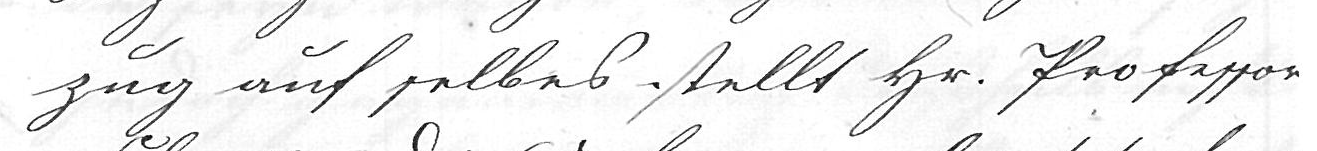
zug auf selbes stellt Hr. Professor
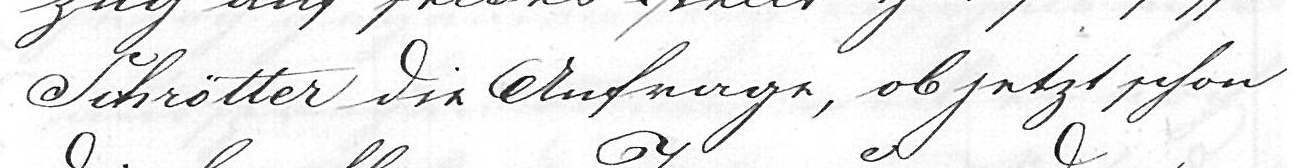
Schrötter die Anfrage, ob jetzt schon
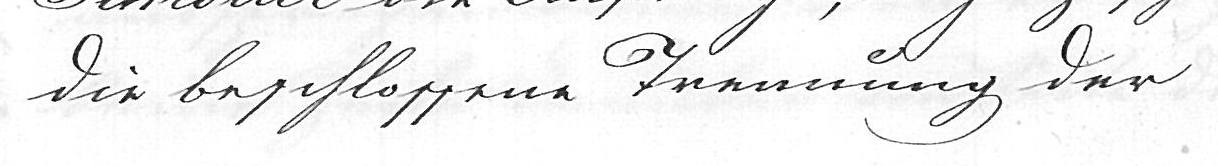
die beschlossene Trennung der
